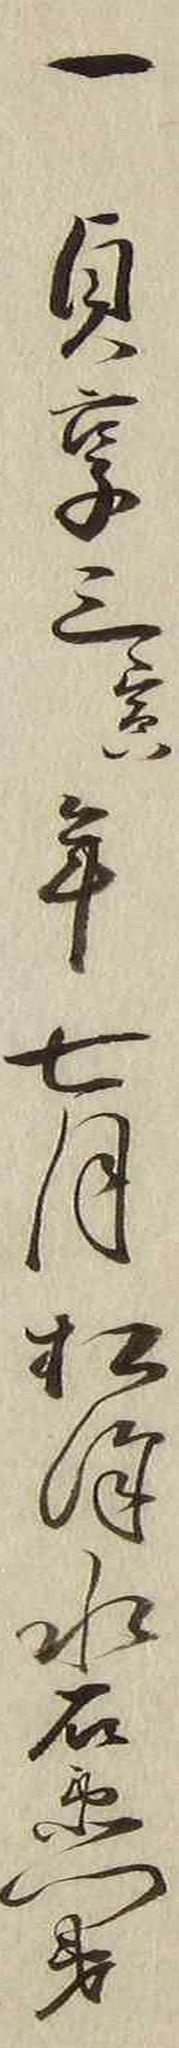一貞享三寅年七月松沢水右衛門弟

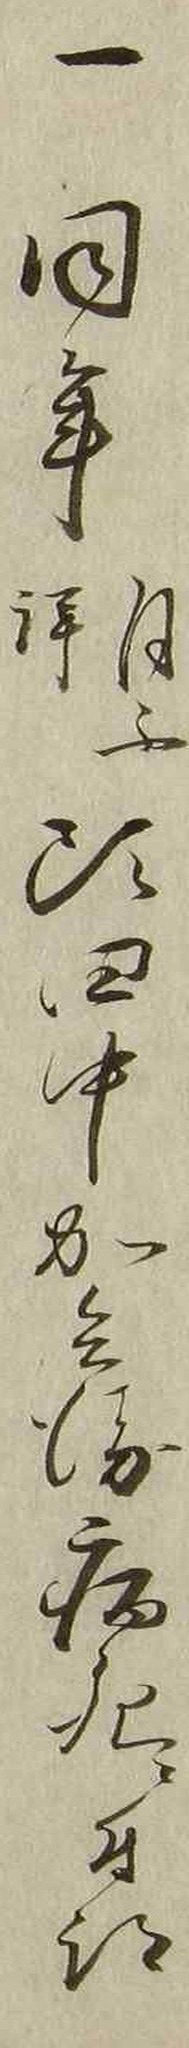一同年月不詳頃田中加兵衛病死ニ付き跡
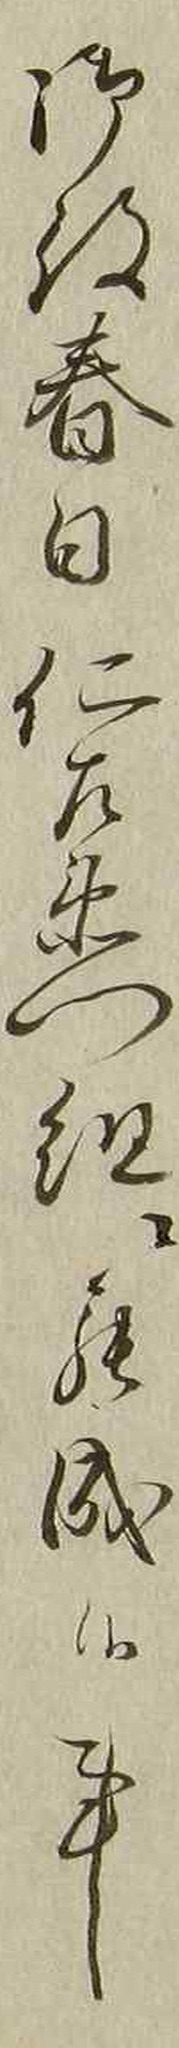御役春日仁左衛門組ニ罷り成り候事
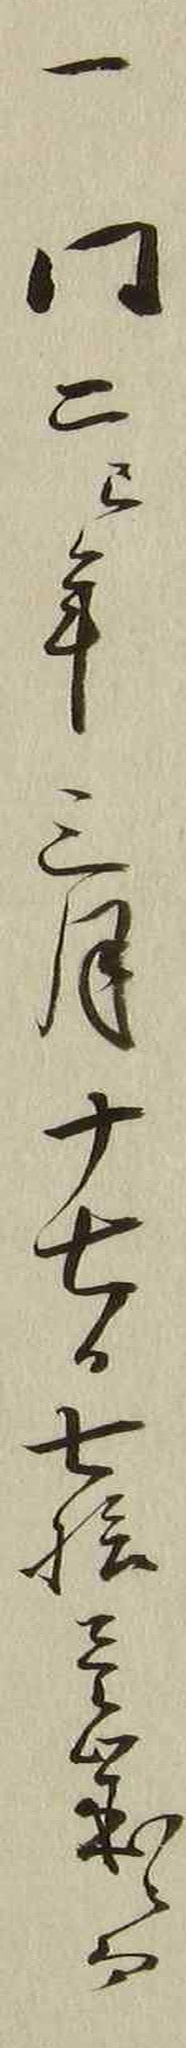一同二巳年三月十七日七拾壱歳ニて
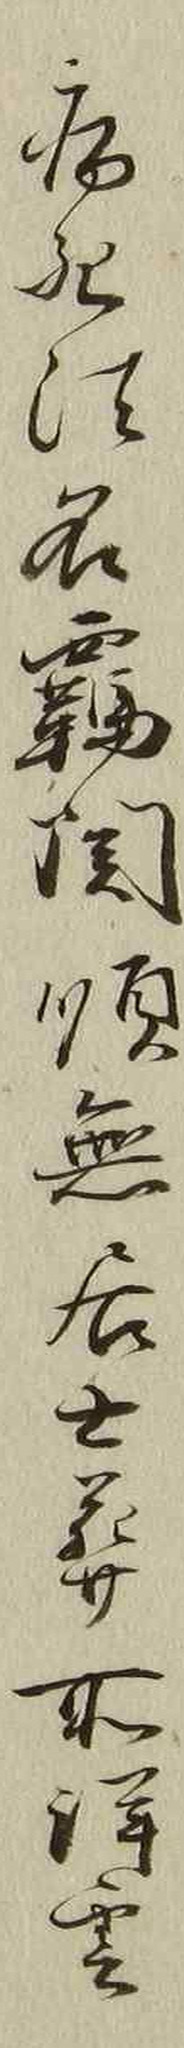病死法名羈関順無居士葬所祥雲
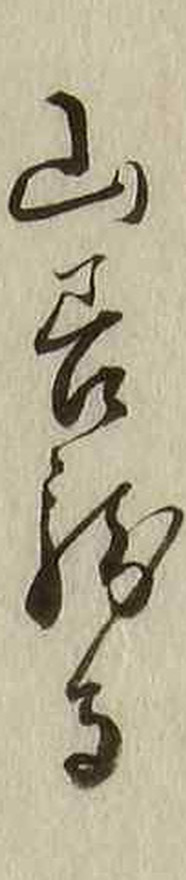山善龍寺
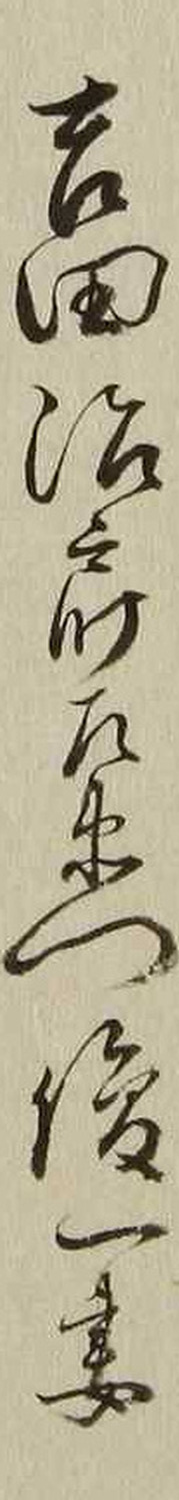女吉田治郎左衛門俊一妻
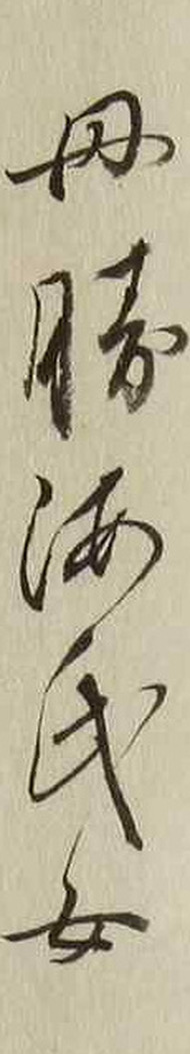母勝海氏女
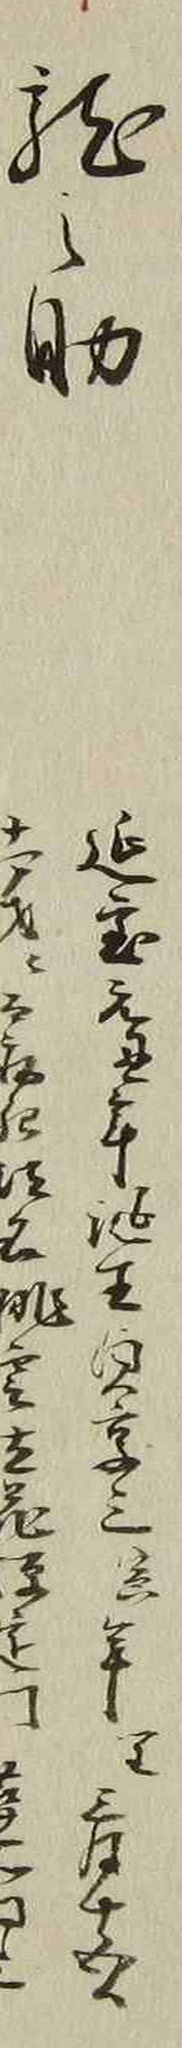延宝元丑年誕生貞享三寅年閏三月十五日
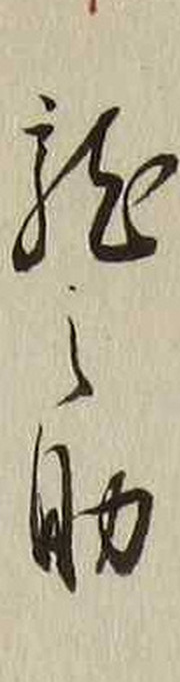七之助
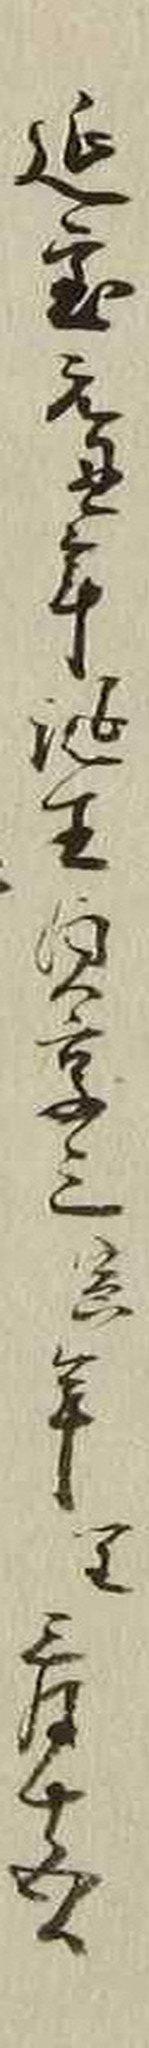延宝元丑年誕生貞享三寅年閏三月十五日
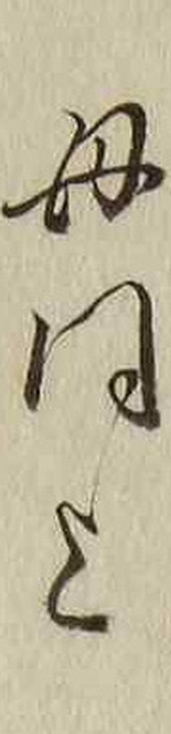母同上
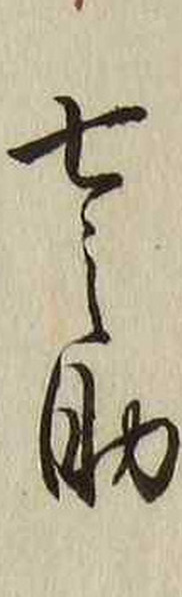七之助
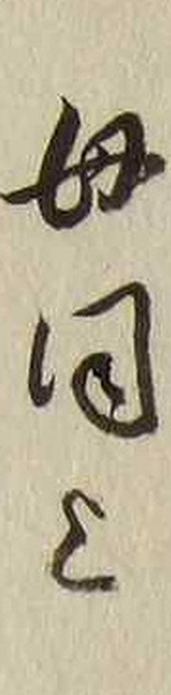母同上

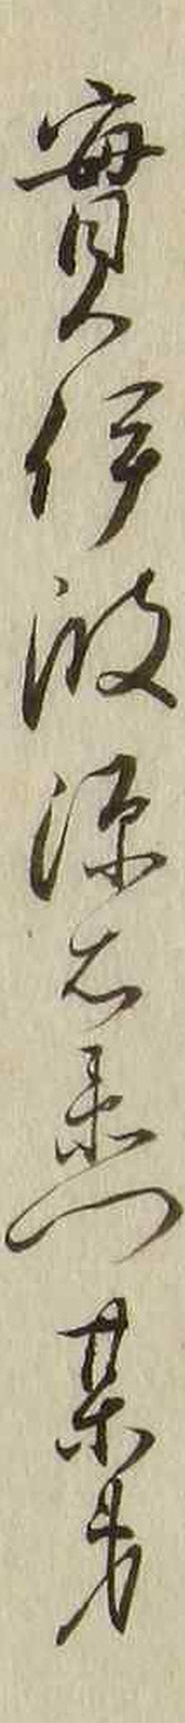実伊波源右衛門某弟
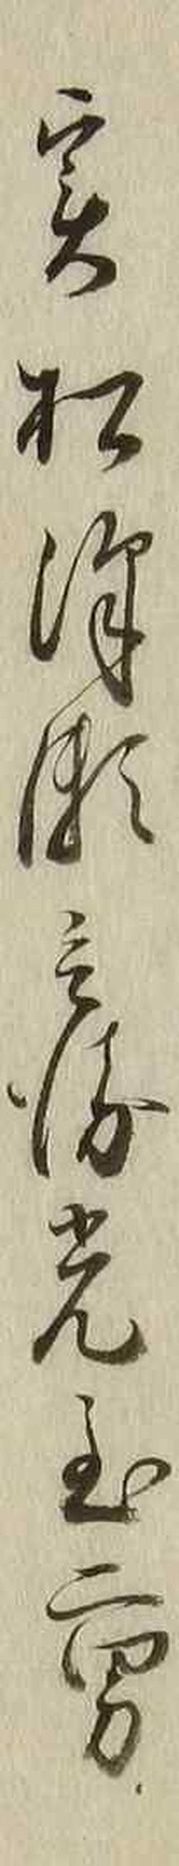実松沢瀬兵衛光玉二男
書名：諸士系譜　巻之20　い之部20
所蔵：会津若松市立会津図書館
